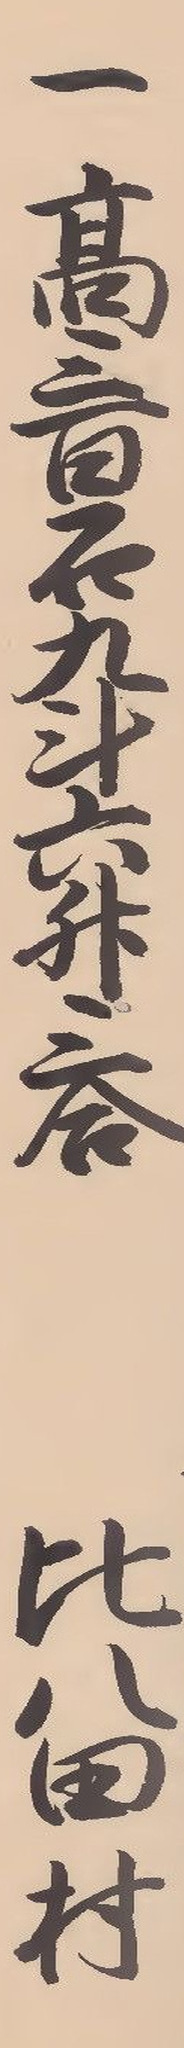一高三百石九斗六升三合比八田村
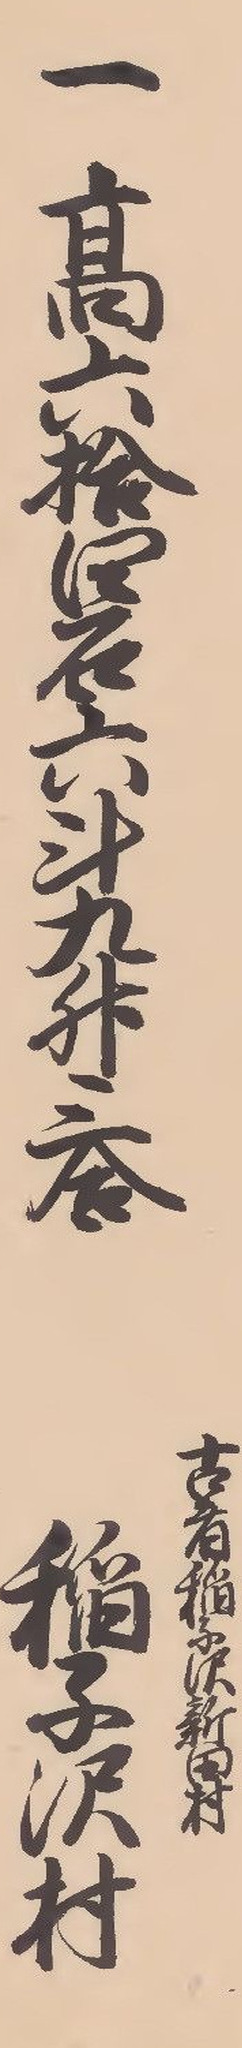一高六拾四石六斗九升三合稲子沢村
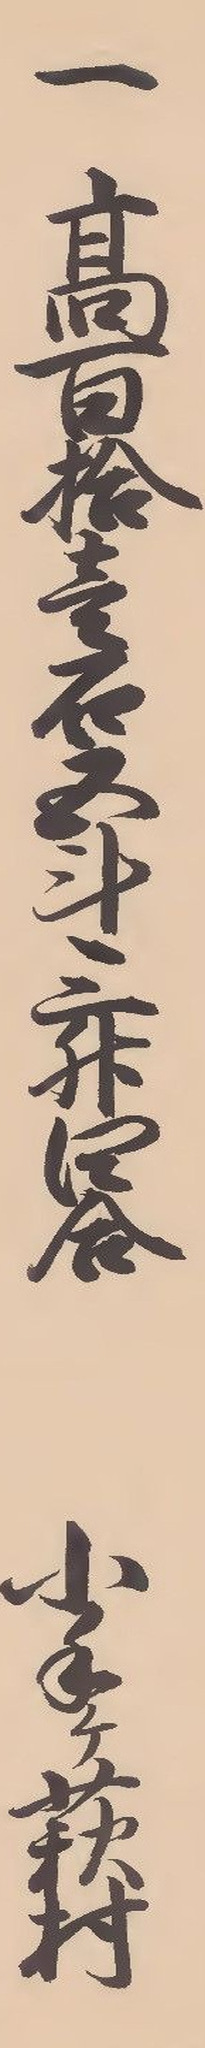一高百拾壱石五斗三升四合小手ケ萩村
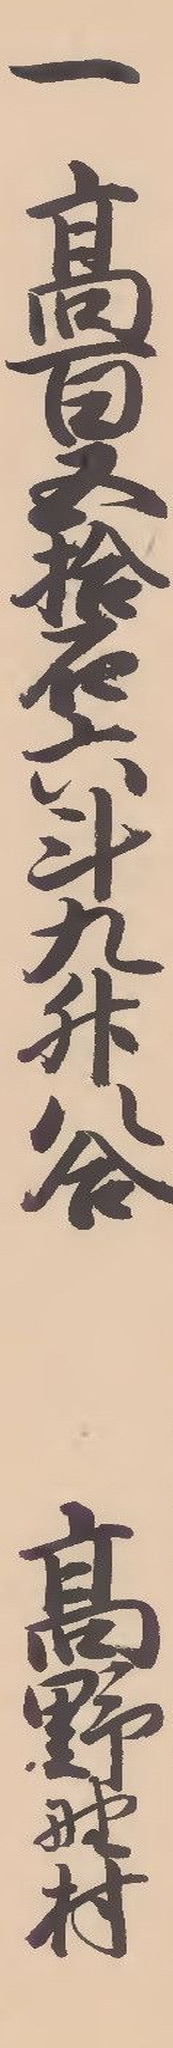一高百五拾石六斗九升八合高野野村

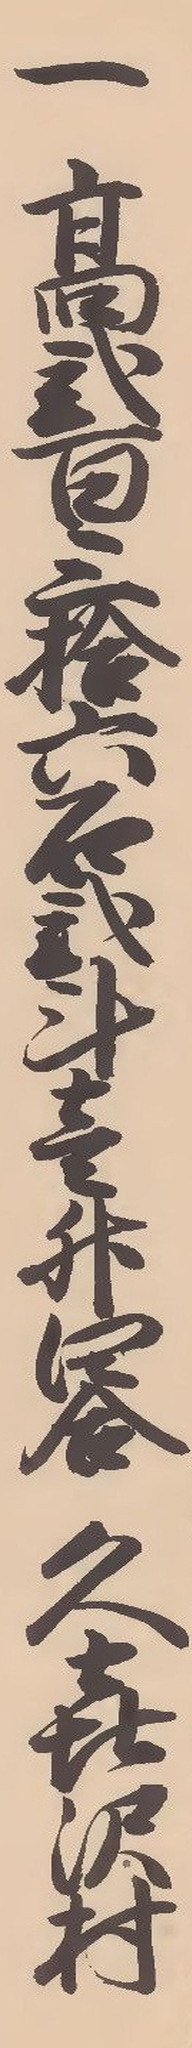一高弐百三拾六石弐斗壱升四合久喜沢村
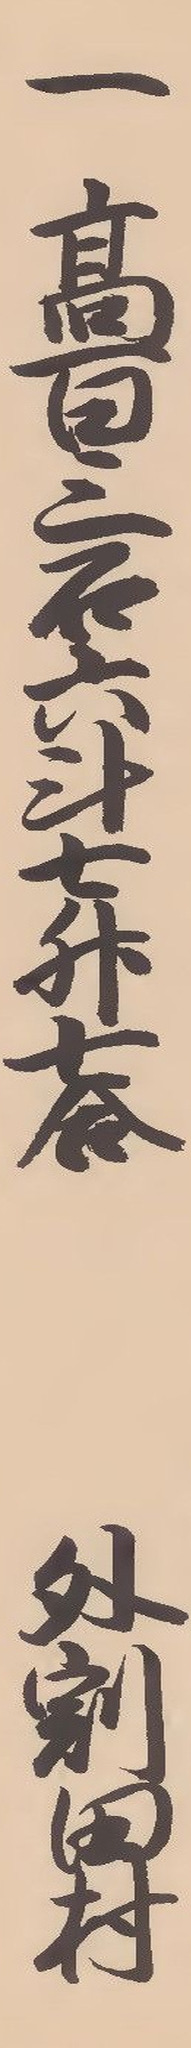一高百三石六斗七升七合外割田村
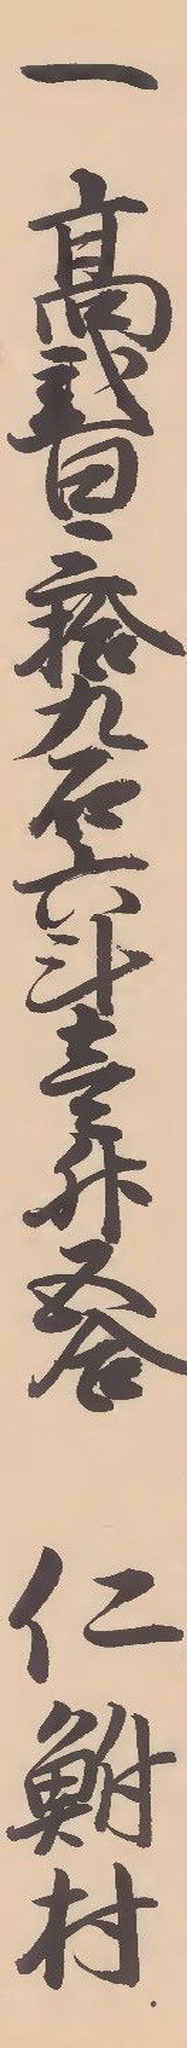一高弐百三拾九石六斗壱升五合仁鮒村
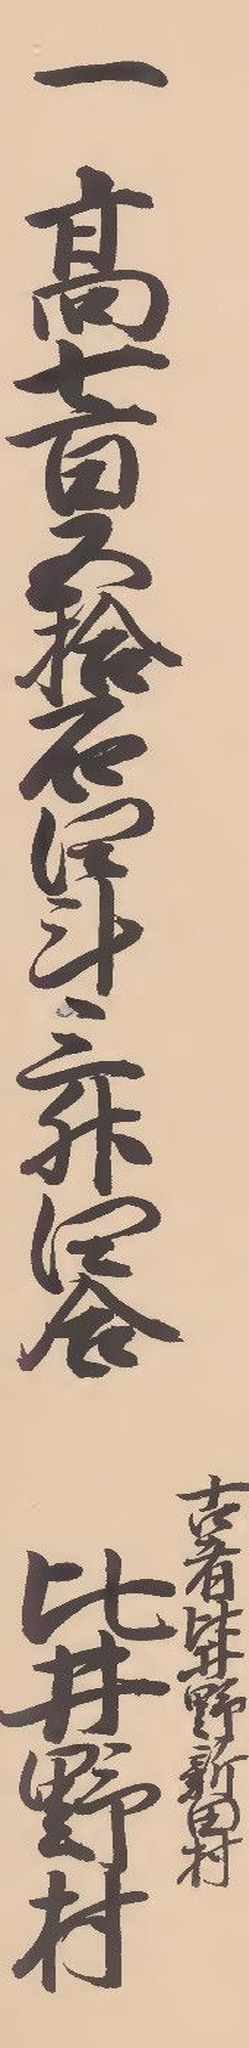一高七百五拾石四斗三升四合比井野村
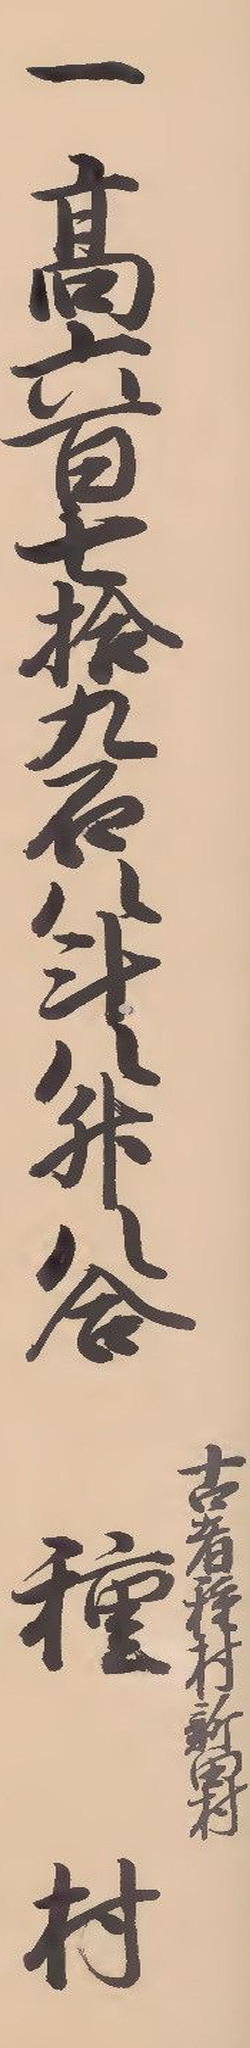一高六百七拾九石八斗八升八合種村
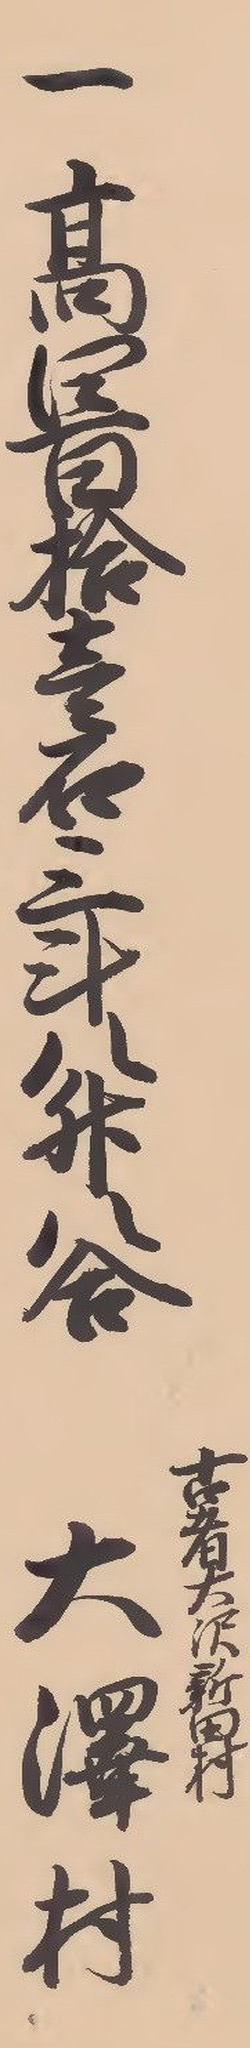一高四百拾壱石三斗八升八合大沢村
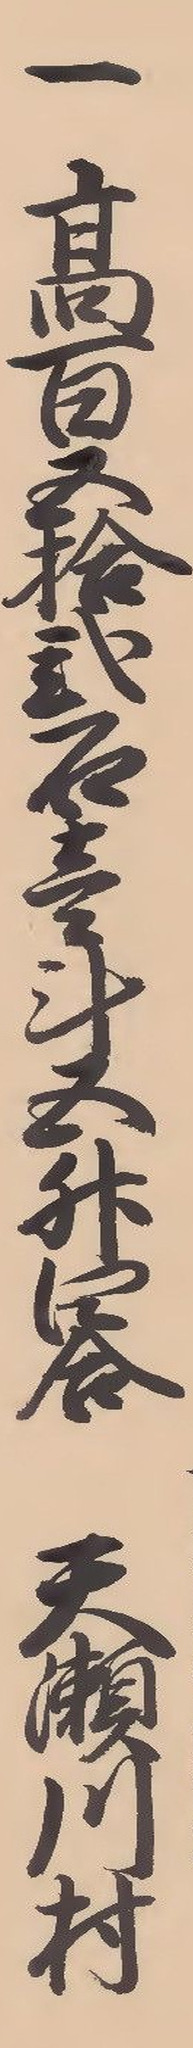一高百五拾弐石壱斗五升四合天瀬川村
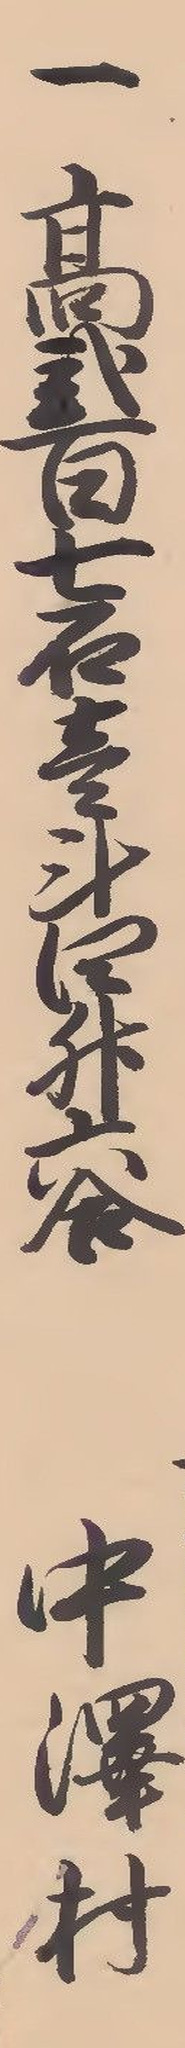一高弐百七石壱斗四升六合中沢村

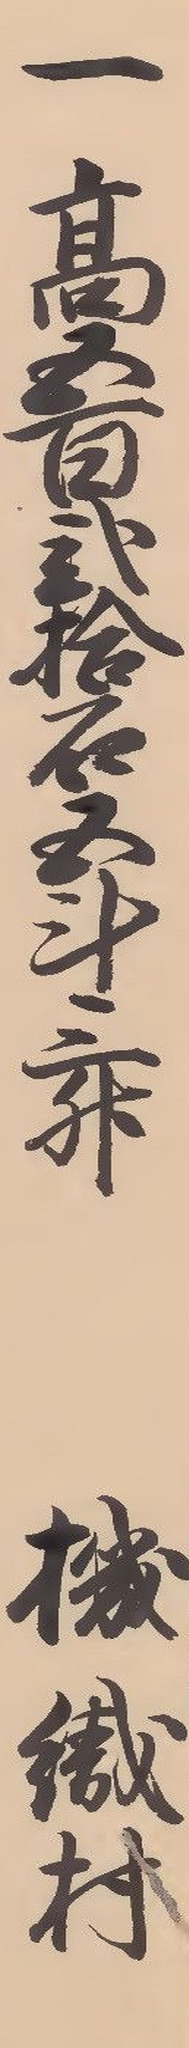一高五百弐拾石五斗三升機織村
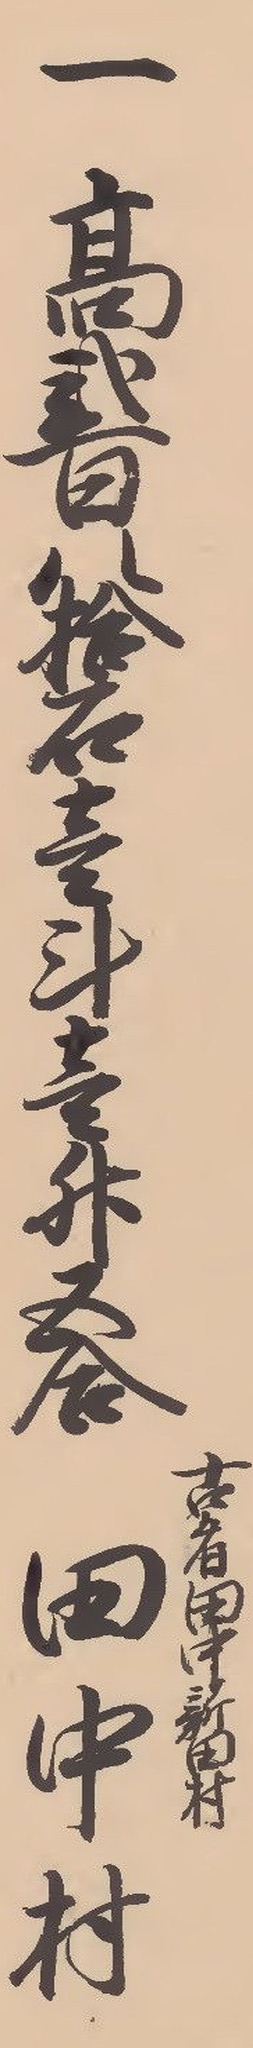一高弐百八拾石壱斗壱升五合田中村
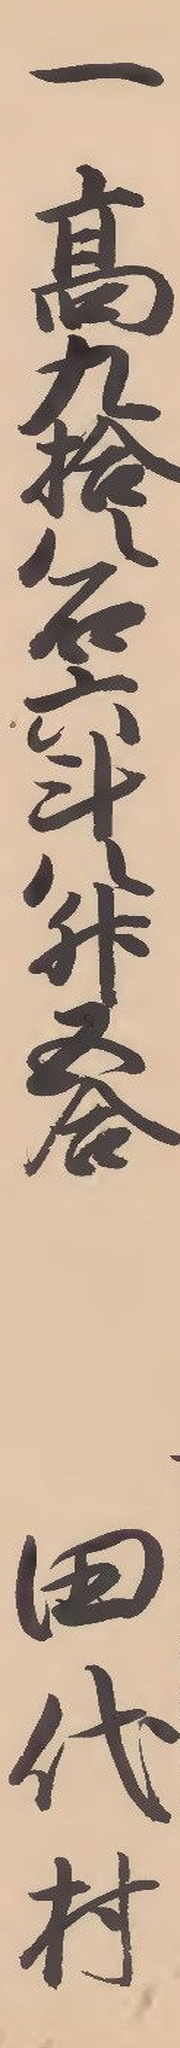一高九拾八石六斗八升五合田代村
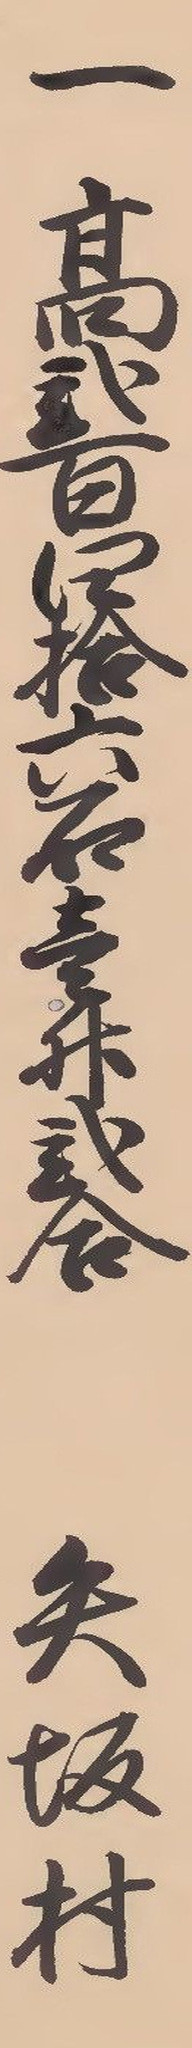一高弐百四拾六石壱升弐合矢坂村
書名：出羽国郷帳　５
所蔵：国立公文書館 National Archives of Japan
